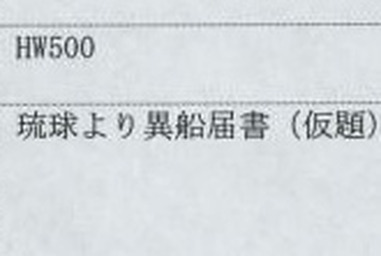琉球より異船届書
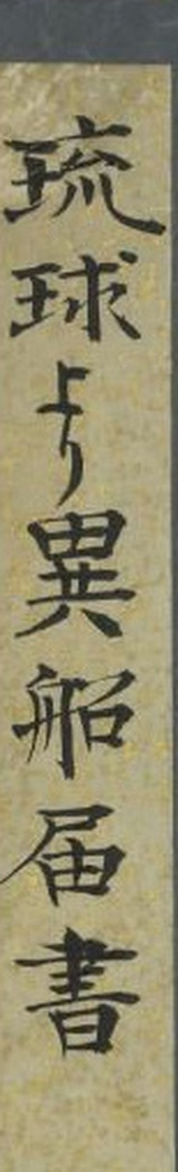琉球より異船届書
